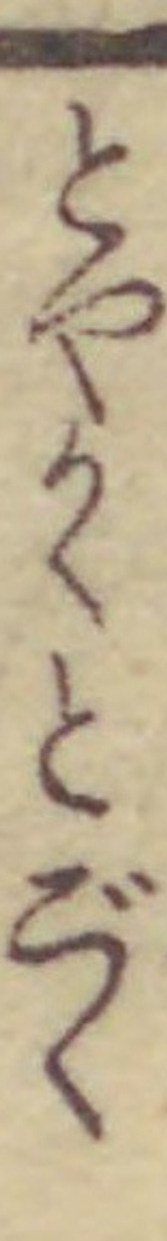とやかくとごく
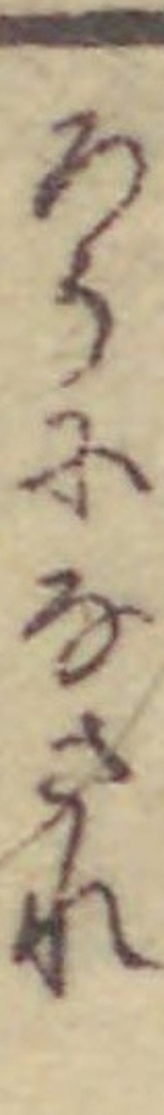ろうになされ
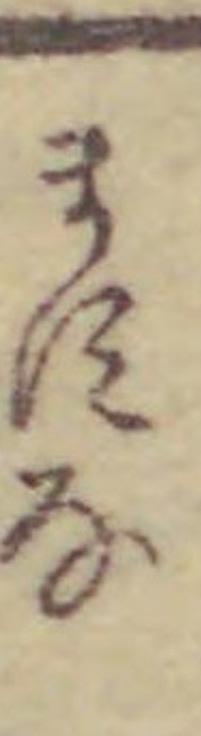やすな
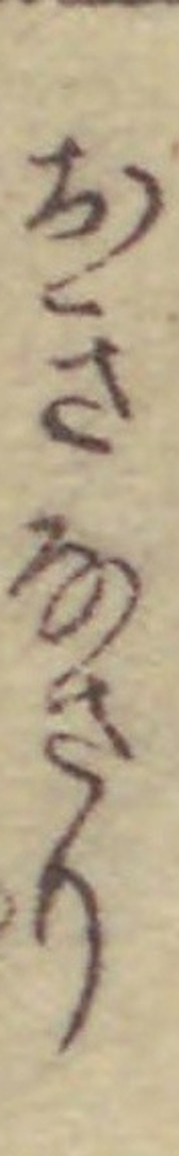おきなさり

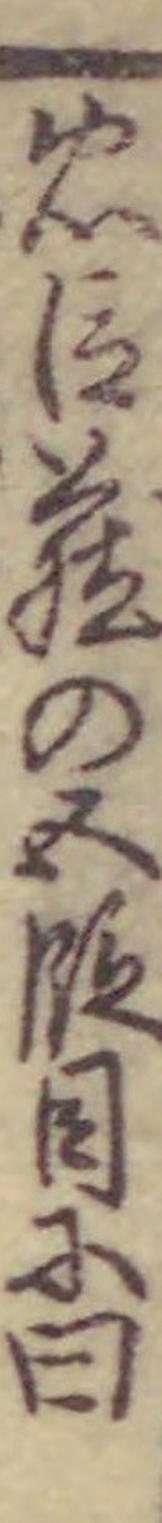忠臣蔵の五段目に曰
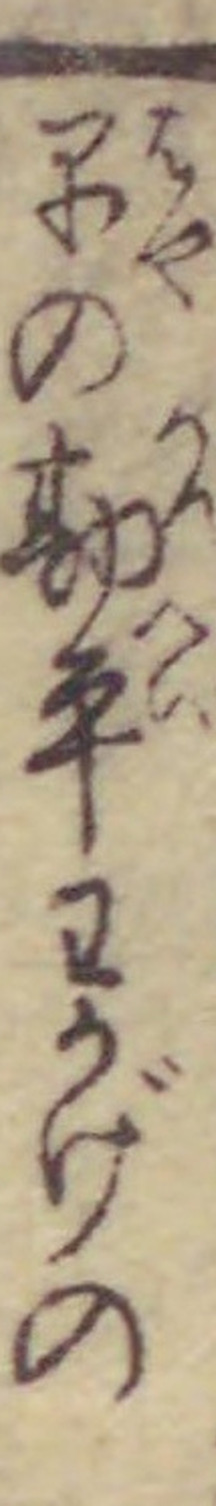早の寛平わかげの
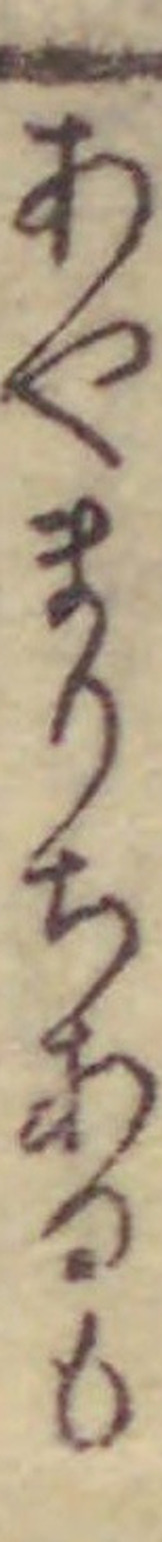あやまりちあるも
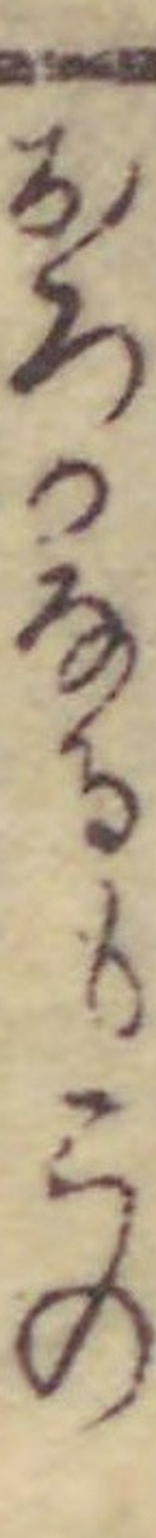おろかなるもこの
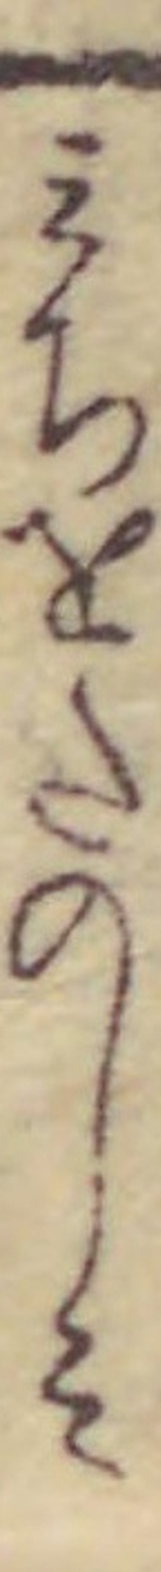みちをたのしみ
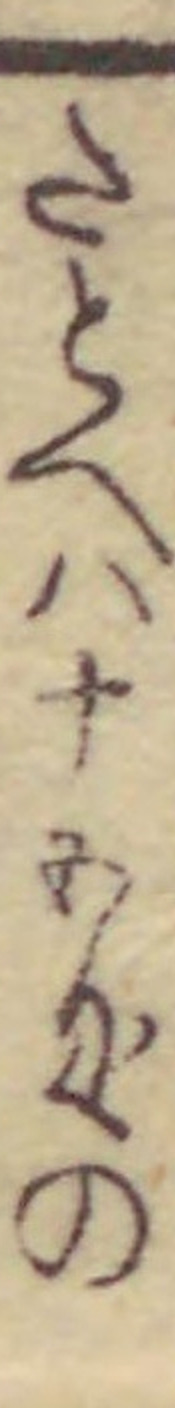たとへ八十五匁の
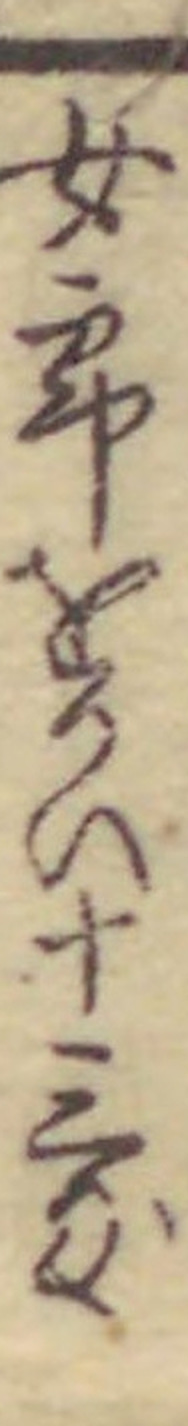女郎をかい十三匁
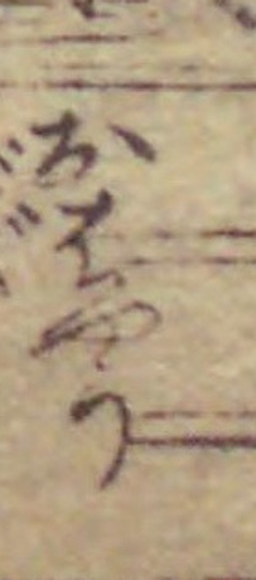おはやう
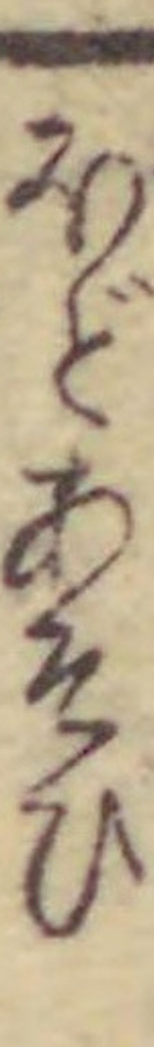ほどあそひ
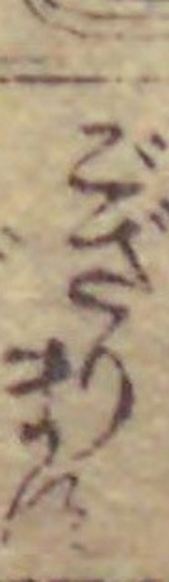ござります
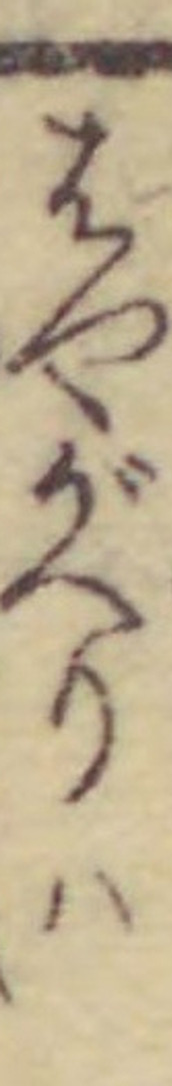はやがへりは
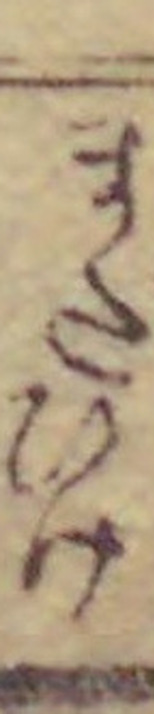まだひけ
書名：大通人穴[サガシ] 3巻
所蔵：国立国会図書館 National Diet Library, JAPAN
